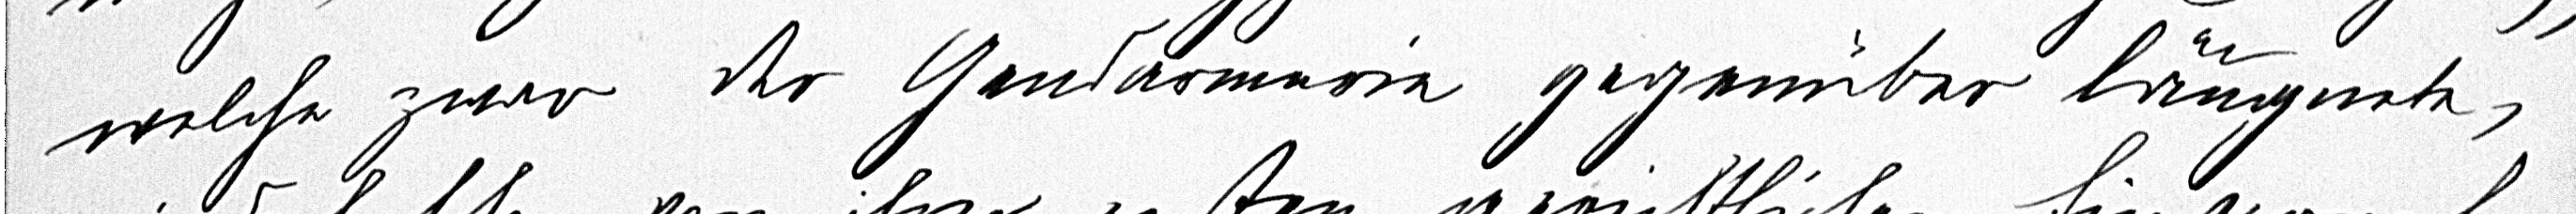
welche zwar der Gendarmerie gegenüber läugnete,
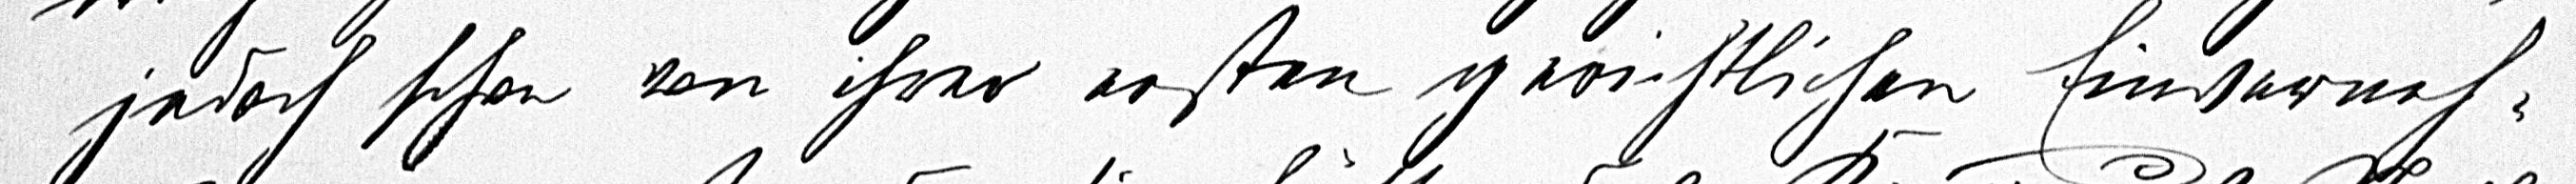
jedoch schon von ihrer ersten gerichtlichen Einverneh¬
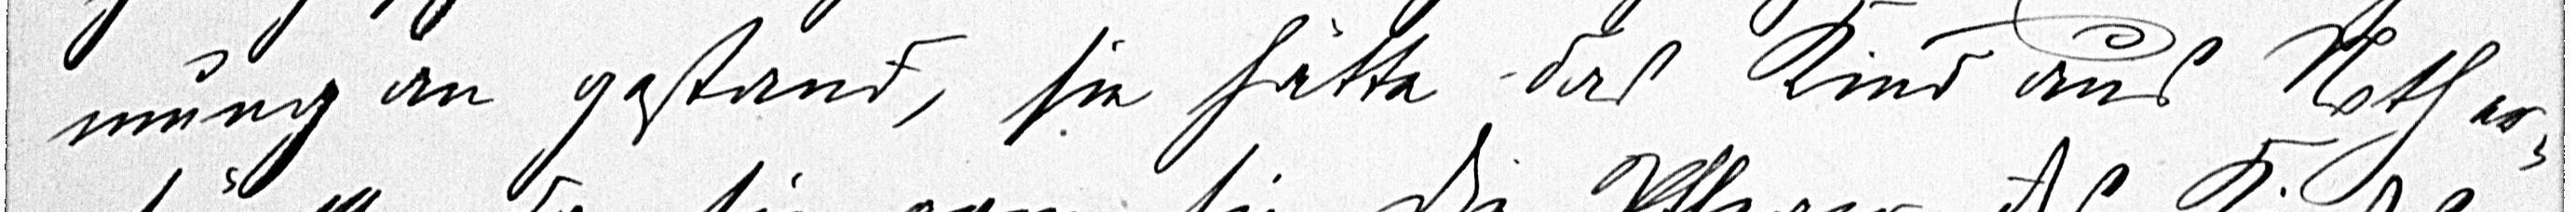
mung an gestand, sie hätte das Kind aus Noth er¬
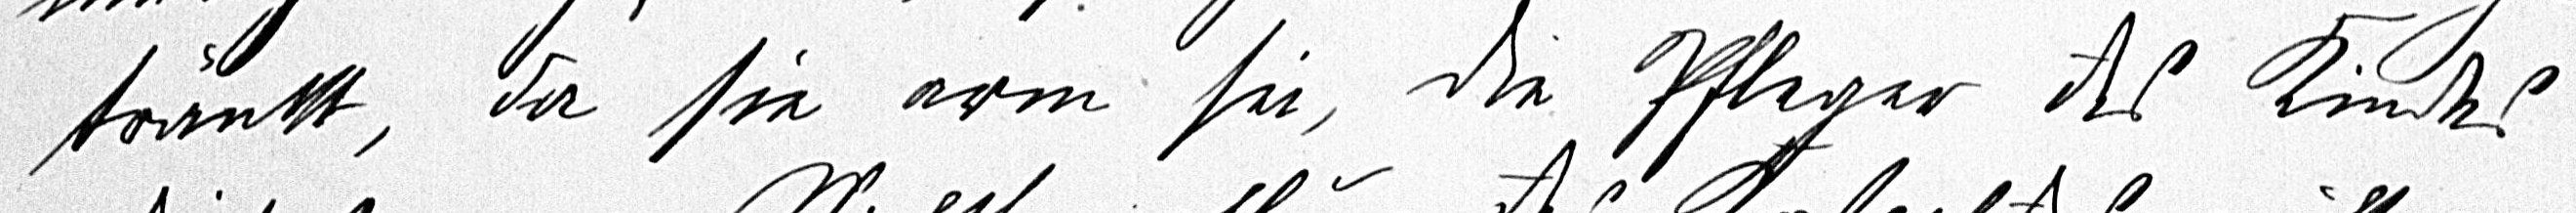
tränkt, da sie arm sie, die Pfleger des Kindes
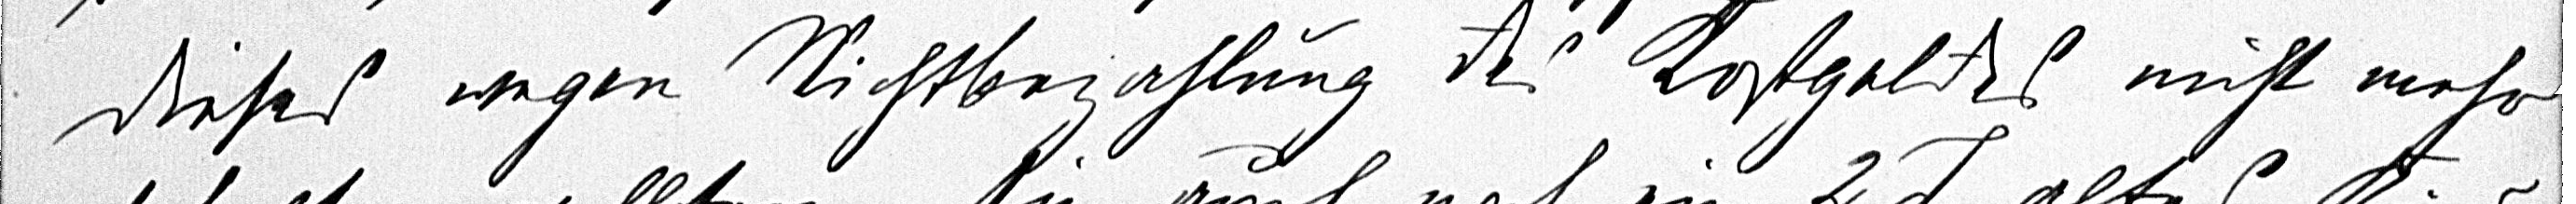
dieses wegen Nichtbezahlung des Kostgeldes nicht mehr
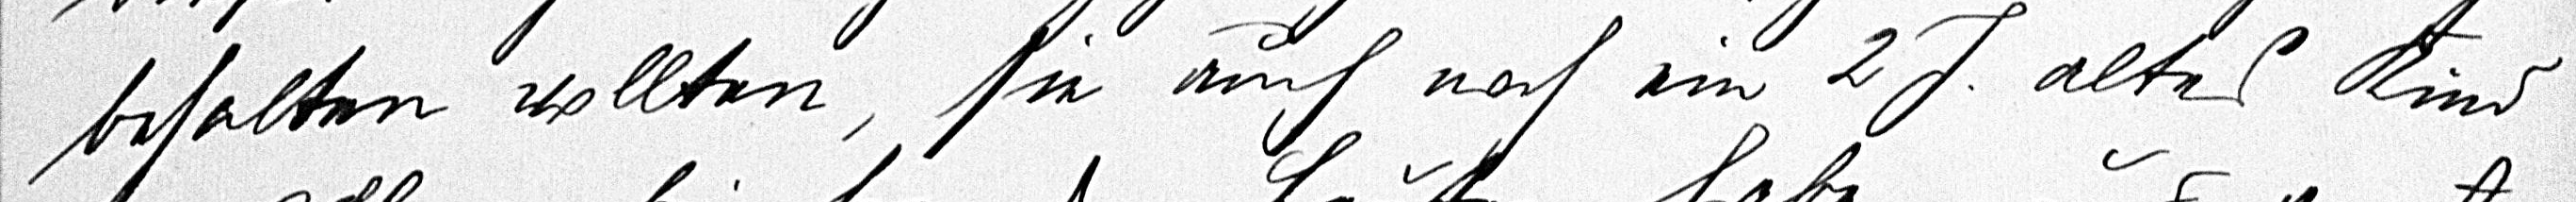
behalten wollten, sie auch noch ein 2 J. altes Kind
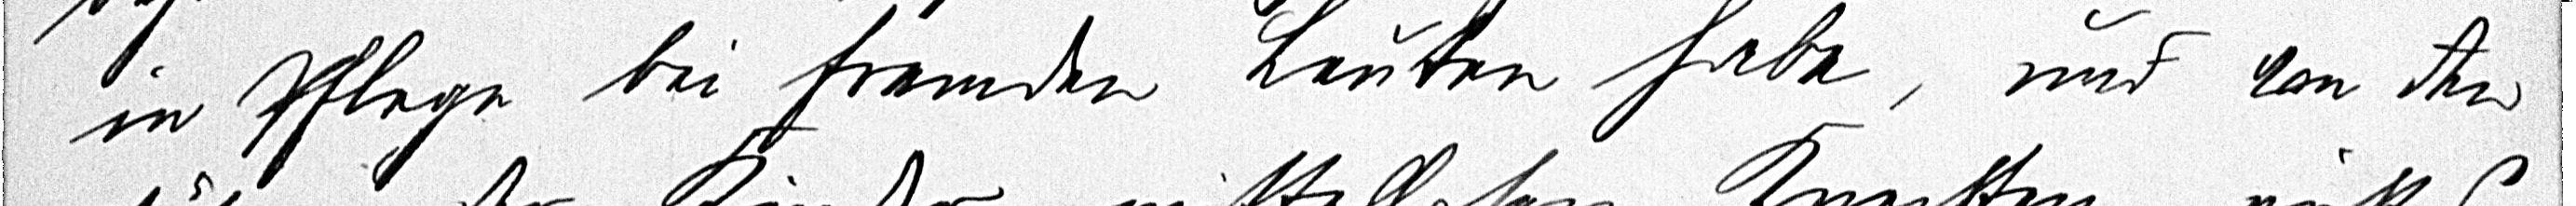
in Pflege bei fremden Leuten habe, und xx den
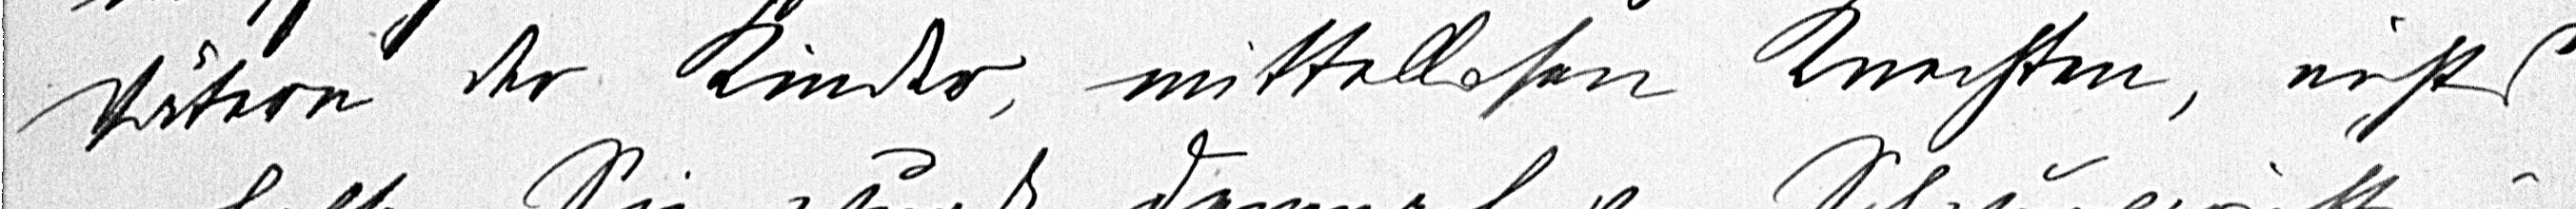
Vätern der Kinder, mittellosen Knechten, nichts
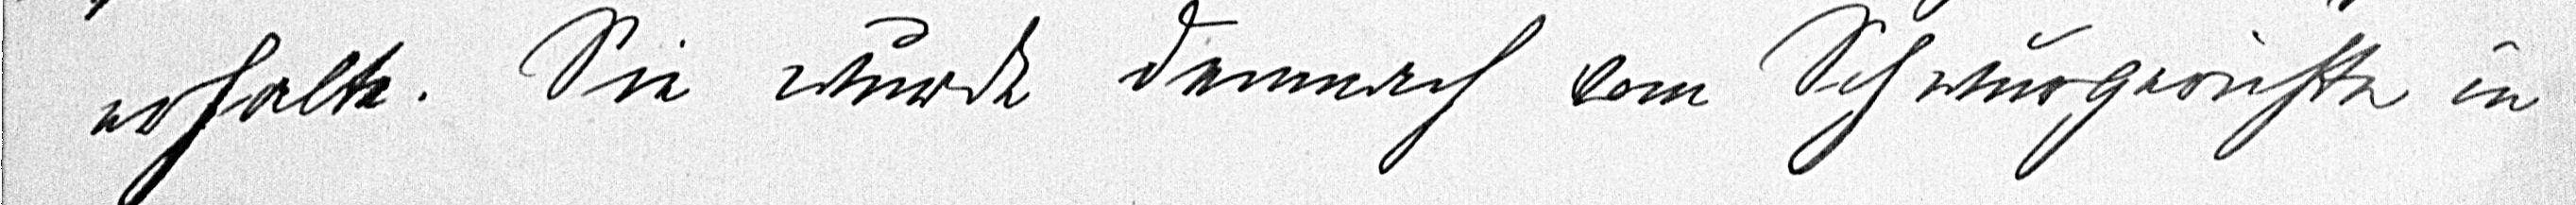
erhalte. Sie wurde demnach vom Schwurgerichte in
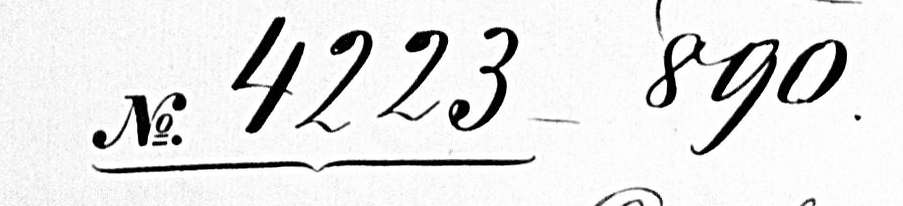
N° 4223-890.
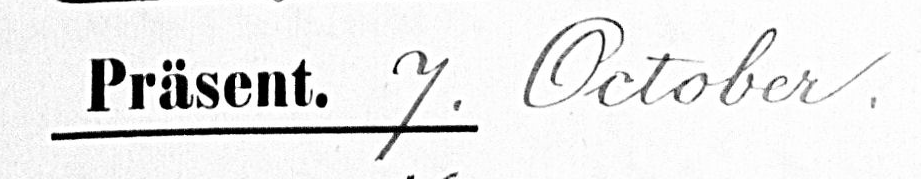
Präsent. 7. October.
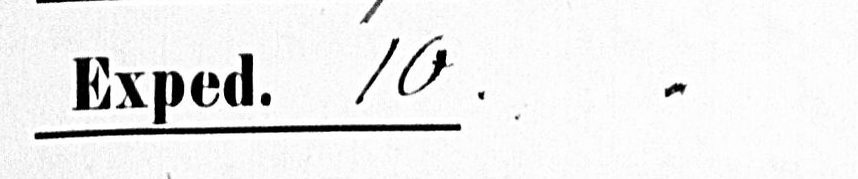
Exped. 10. October.
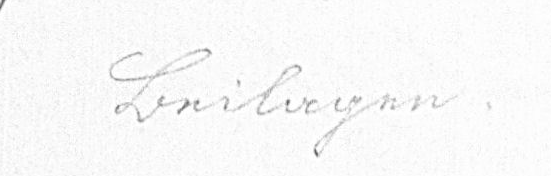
Beilagen.
